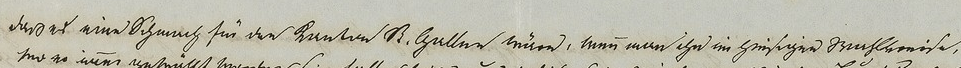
daß es eine Schmach für den Kanton St. Gallen wäre, wenn man ihn im hiesigen Wahlkreise,
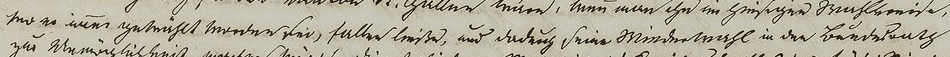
wo er immer gewählt worden sei, fallen ließe, und dadurch seine Wiederwahl in den Bundesrath
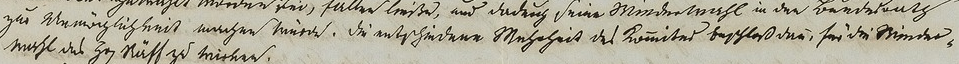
zur Unmöglichkeit machen würde. Die entschiedene Mehrheit des Komites beschloß dann, für die Wieder-
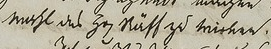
wahl des Hr. Näff zu wirken.
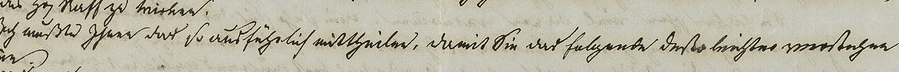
Ich mußte Ihnen das so ausführlich mittheilen, damit Sie das folgende desto leichter verstehen
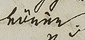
können.
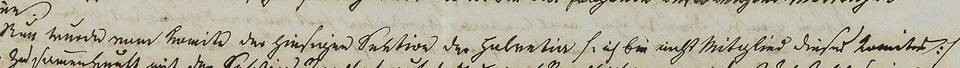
Nun wurde vom Komite der hiesigen Sektion der Helvetier (ich bin nicht Mitglied dieses Komites)
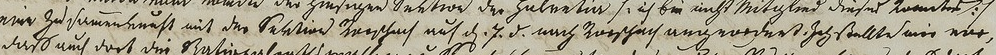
eine Zusammenkunft mit der Sektion Rorschach auf d. 7. d. nach Rorschach angeordnet. Ich stellte mir vor,
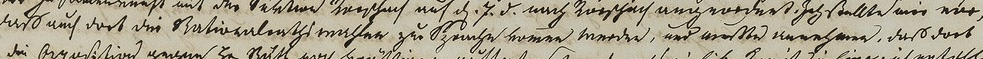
daß auch dort die Nationalrathswahlen zur Sprache kommen werden, und musste annehmen, daß dort
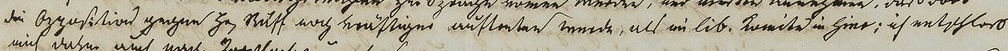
die Opposition gegen Hr. Näff noch kräftiger auftreten werde, als im lib. Komite in hier; ich entschloß
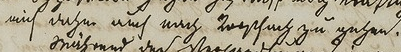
mich daher auch nach Rorschach zu gehen.
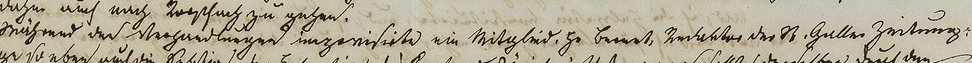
Während der Verhandlungen imponisirte ein Mitglied, Hr. Bernet, Redaktor der St. Galler Zeitung:
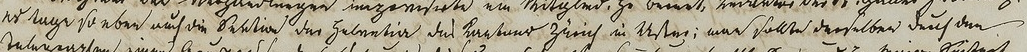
es tage so eben auch die Sektion der Helvetier des Kantons Zürich in Uster; man sollte derselben durch den
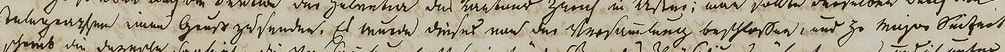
Telegraphen einen Gruß zu senden. Es wurde dieses von der Versammlung beschloßen, und Hr. Mayor Seifert
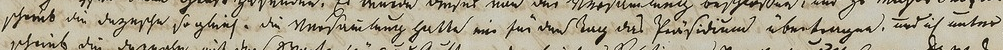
schrieb die Depesche so gleich. Die Versammlung hatte mir für den Tag das Präsidium übertragen, und ich unter-
